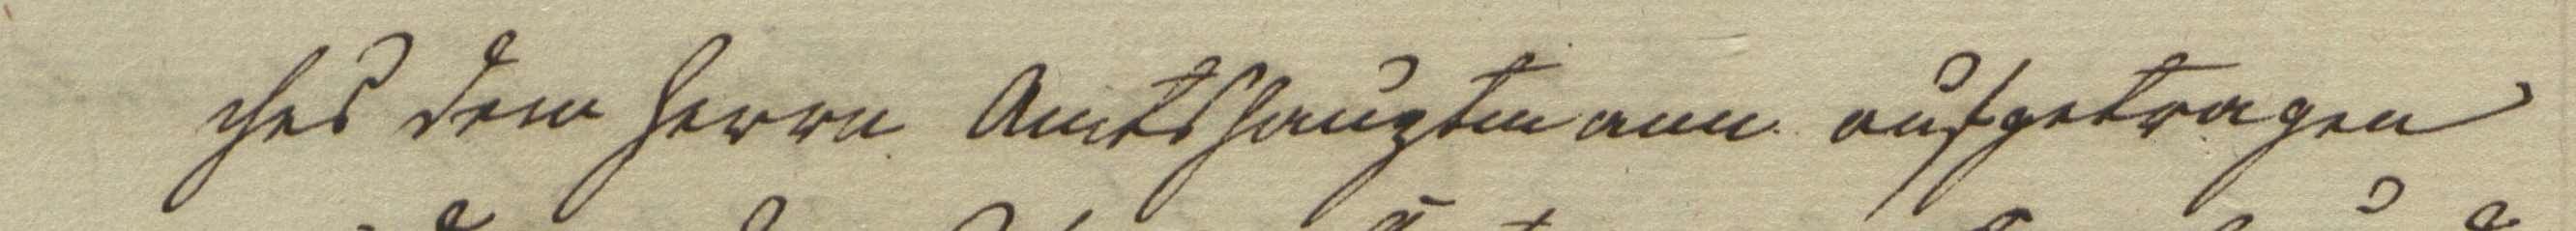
ches dem Herrn Amtshauptmann aufgetragen
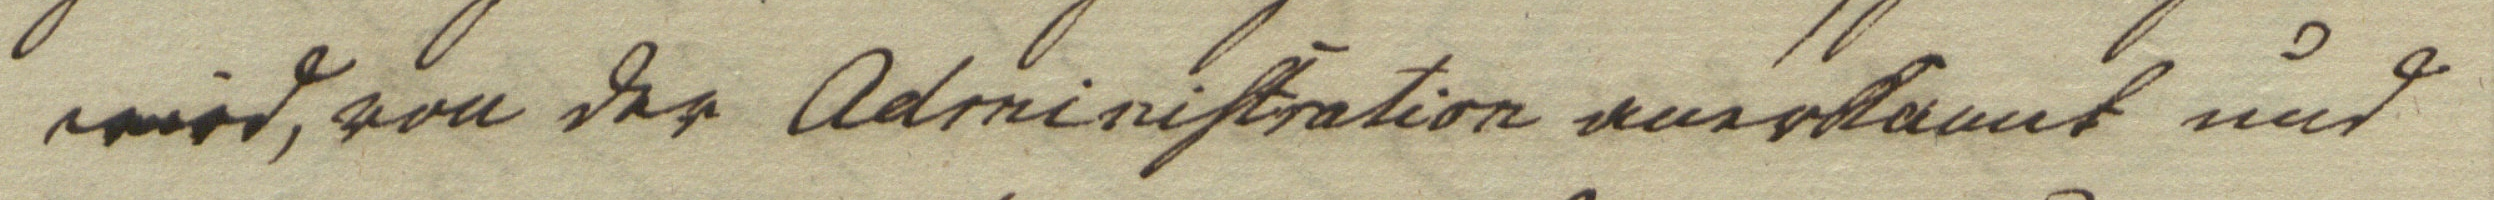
wird, von der Administration anerkannt und
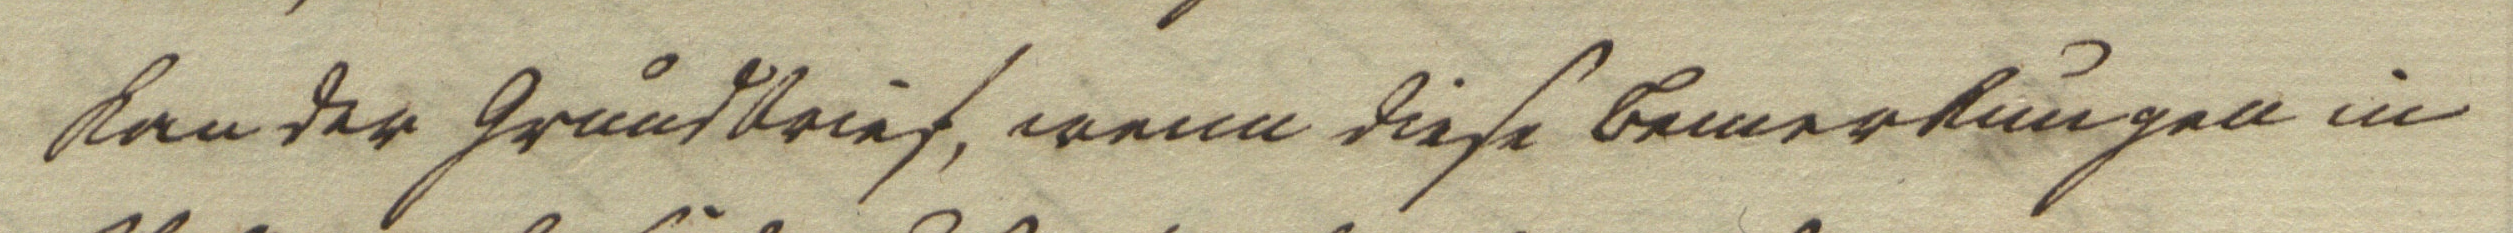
kan der Grundbrief, wenn diese Bemerkungen in
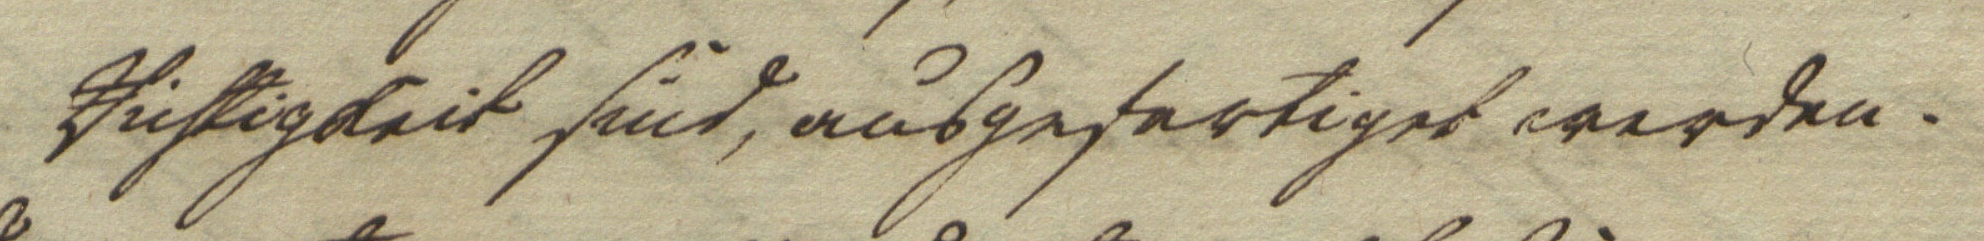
Richtigkeit sind, ausgefertiget werden.
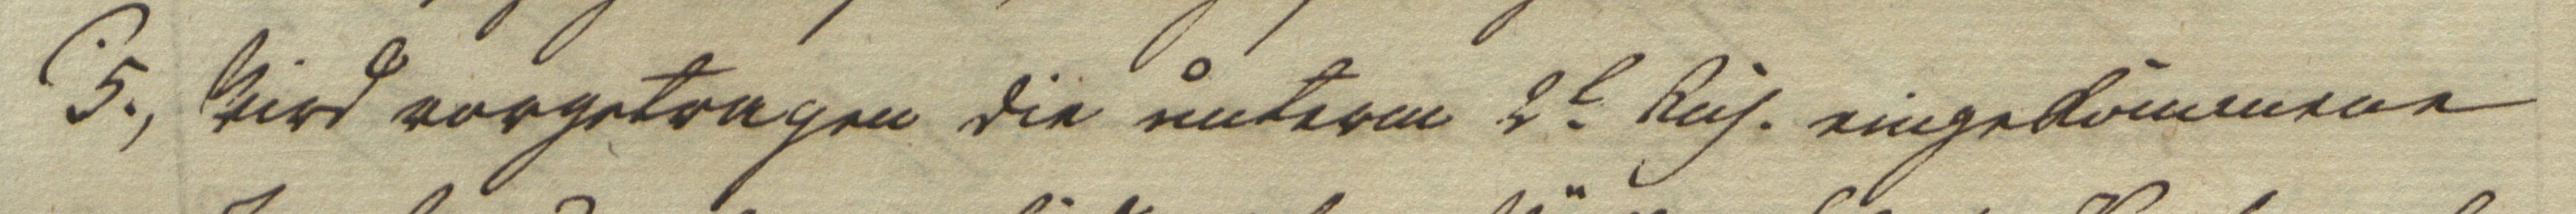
5., Wird vorgetragen die unterm 2t. huj. eingekommene
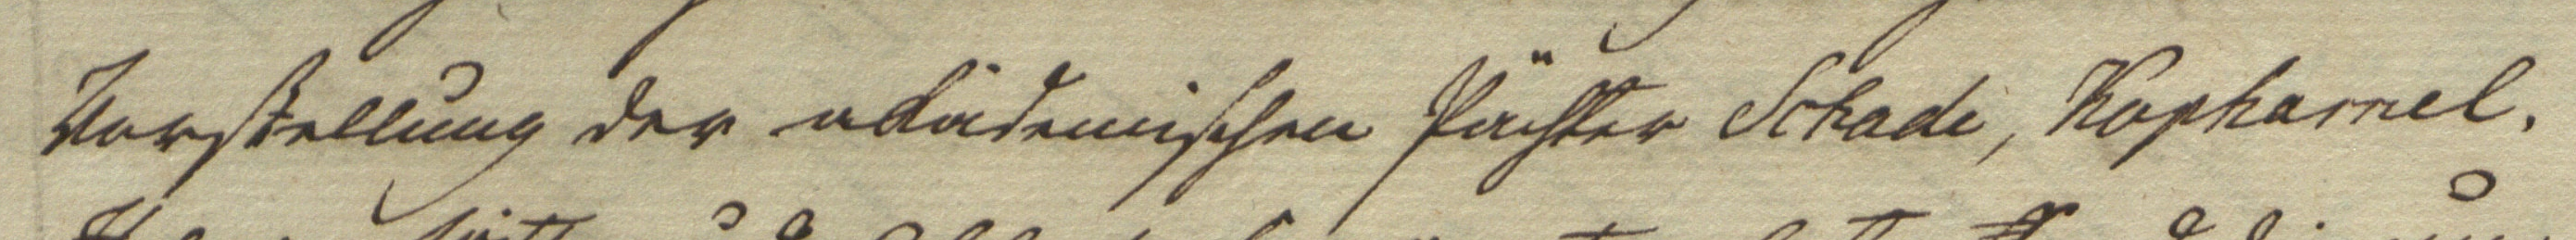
Vorstellung der akademischen Pächter Schade, Kaphamel,
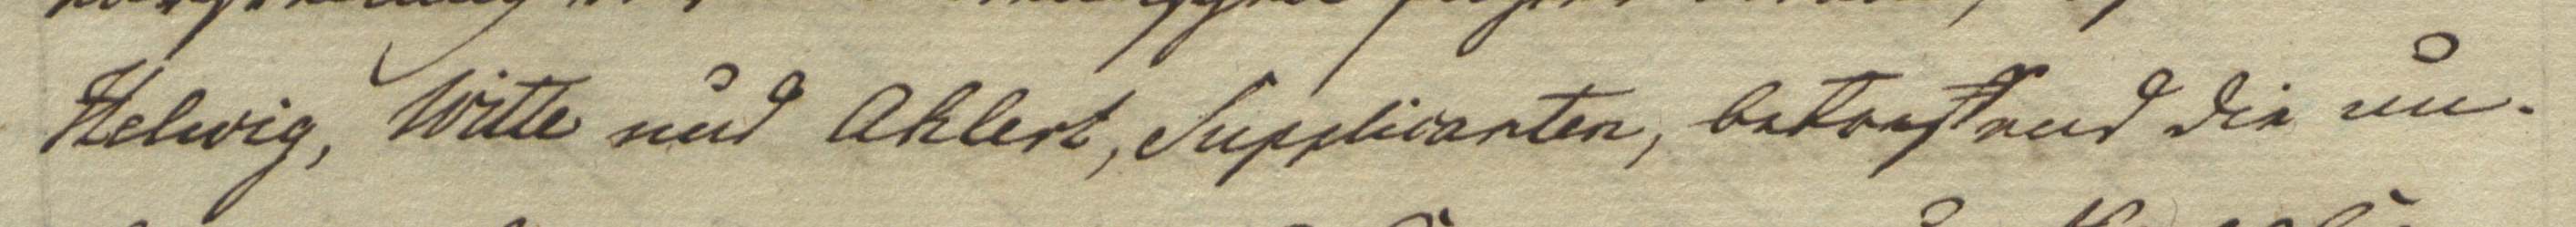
Helwig, Witte und Ahlert, Supplicanten, betreffend die un¬
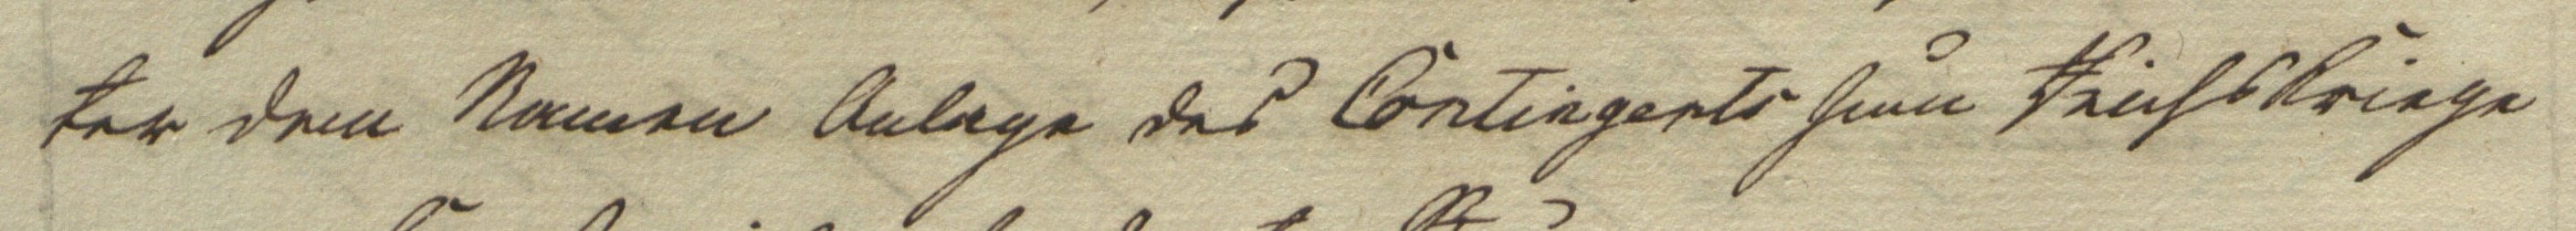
ter dem Namen Anlage des Contingents zum Reichskriege
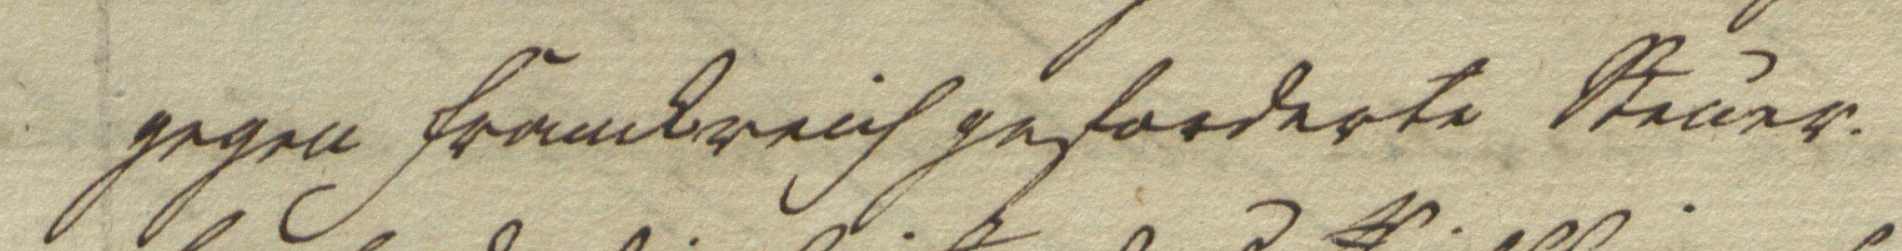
gegen Frankreich geforderte Steuer.
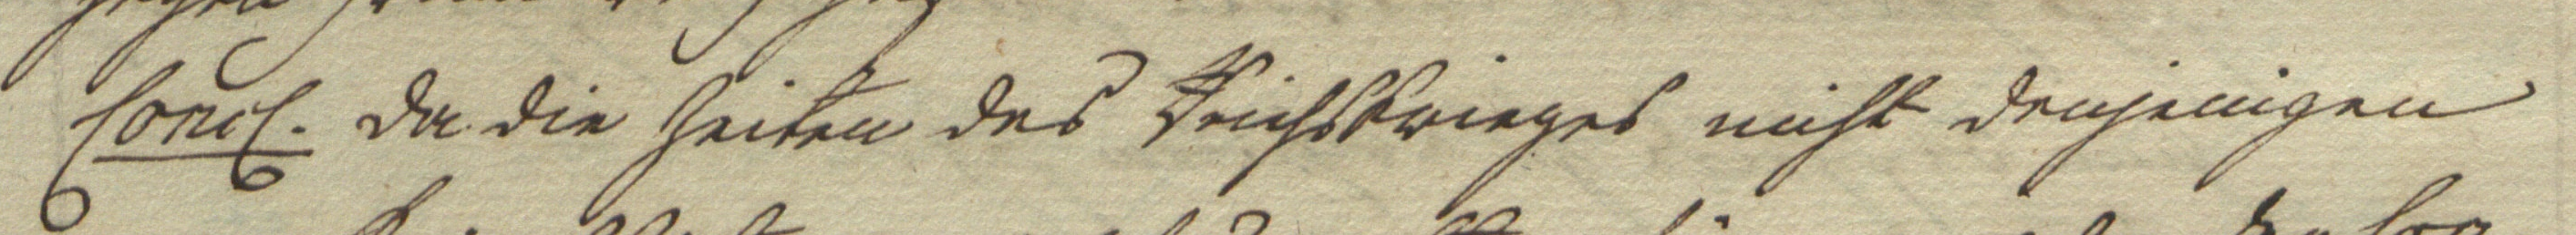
Concl. Da die Zeiten des Reichskrieges nicht denjenigen
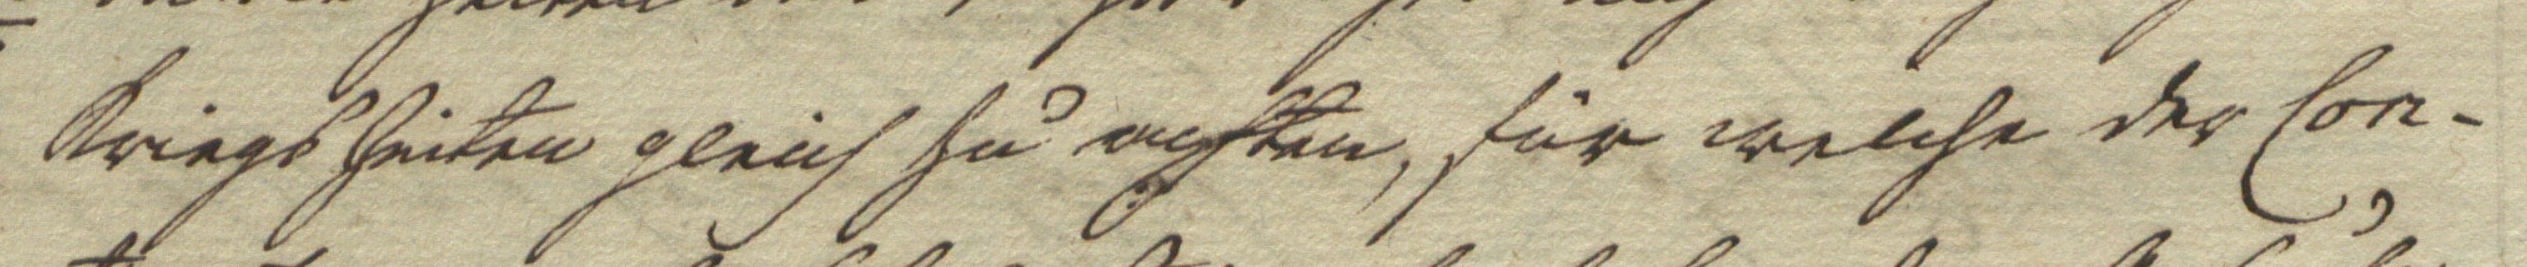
Kriegszeiten gleich zu achten, für welche der Con¬
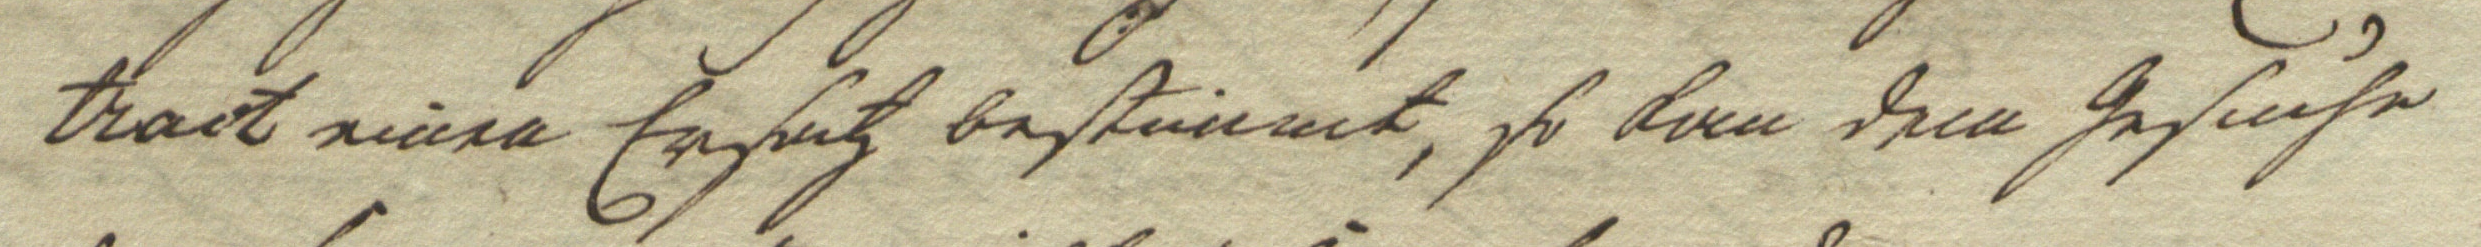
tract einen Ersatz bestimmt, so kan dem Gesuche
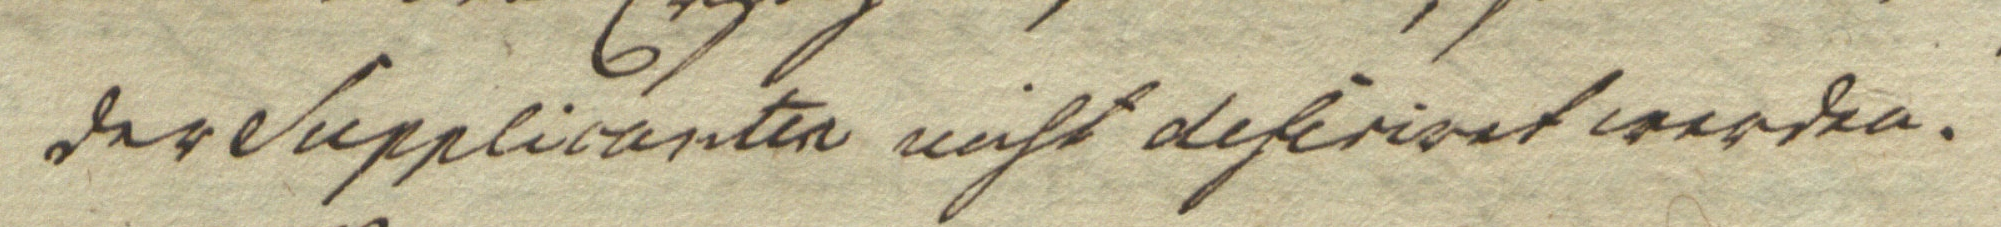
der Supplicanten nicht deferiret werden.
